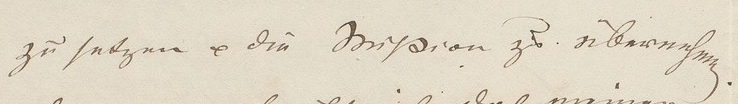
zu setzen & die Mißion zu übernehmen.
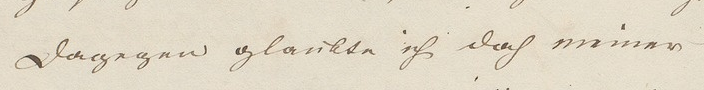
Dagegen glaubte ich meiner
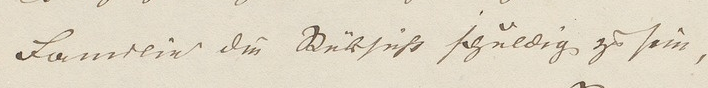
Familie die Rüksicht schuldig zu sein,
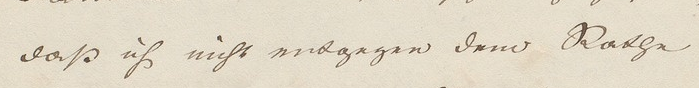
daß ich nicht entgegen dem Rathe
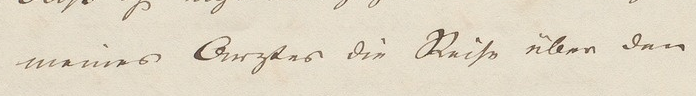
meines Arztes die Reise über den
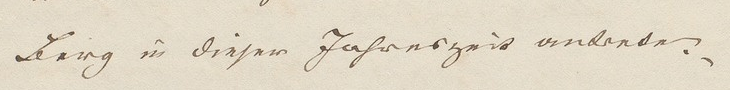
Berg in dieser Jahreszeit antretete. –
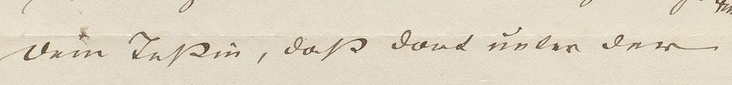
dem Teßin, daß dort unter der
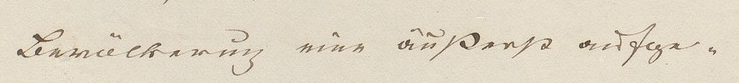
Bevölkerung eine äußerst aufge-
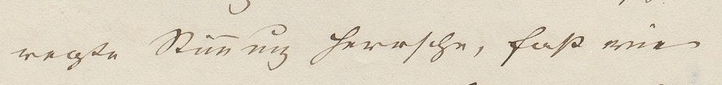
regte Stimmung herrsche, fast wie
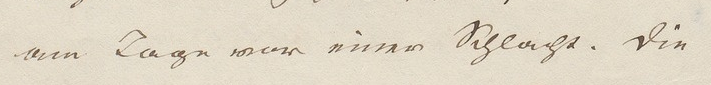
am Tage vor einer Schlacht. Die
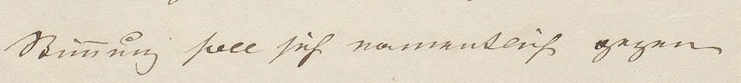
Stimmung soll sich namentlich gegen
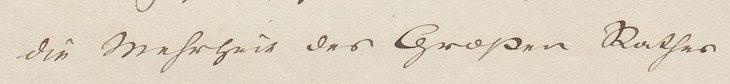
die Mehrheit des Großen Rathes
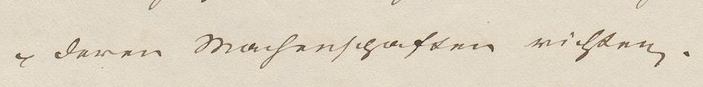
& deren Machenschaften richten.
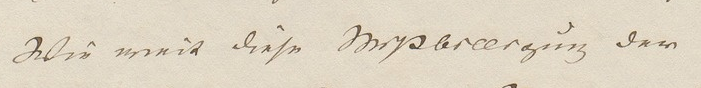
Wie weit diese Mißbilligung der
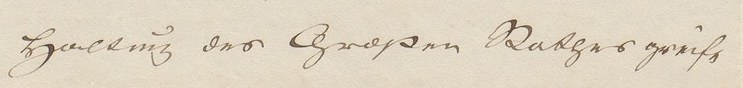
Haltung des Großen Rathes greift
